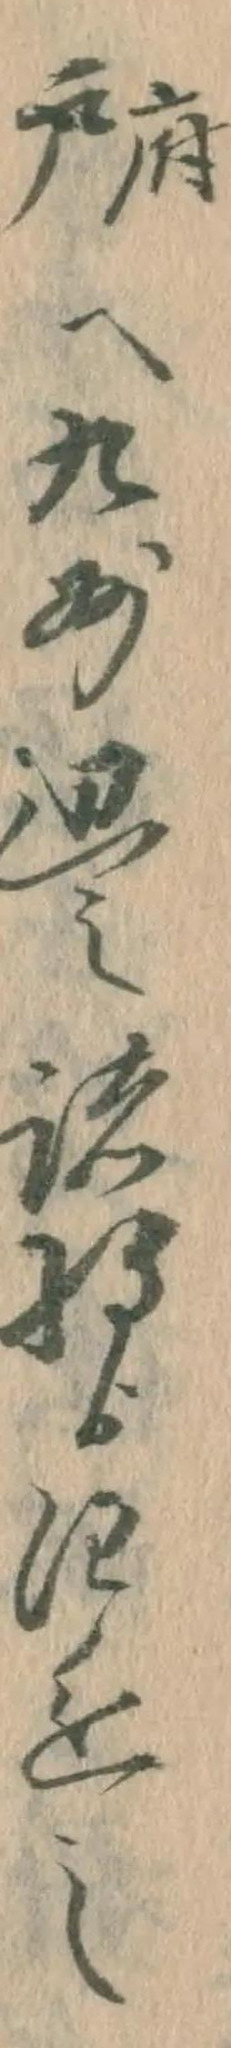府へ九州辺之諸将ゟ注進之
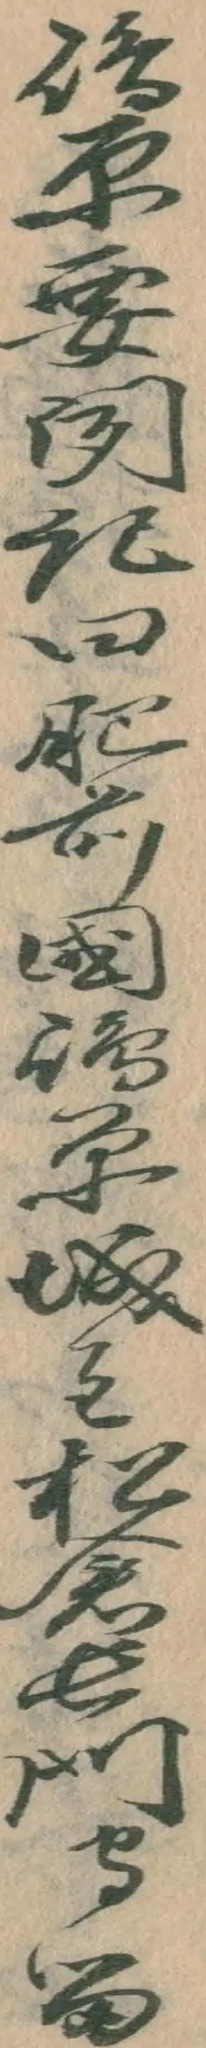島原要聞紀曰肥前国島原城主松倉長門守留
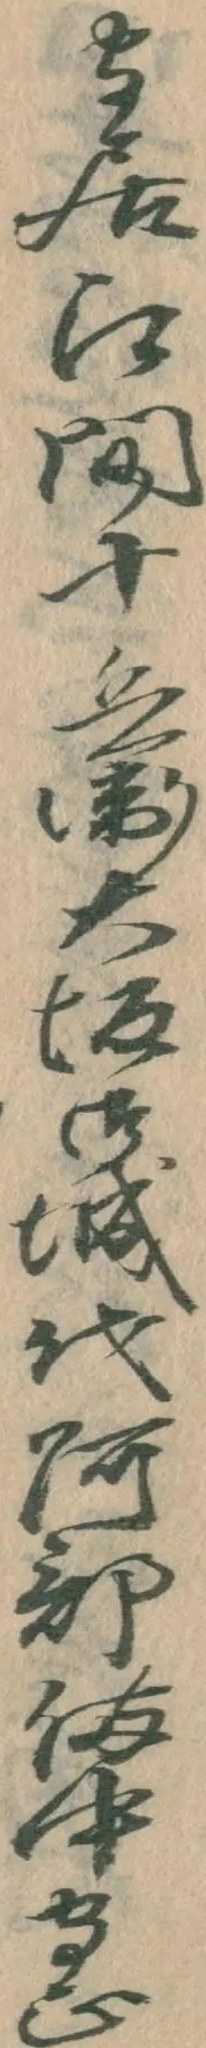守居江間十兵衛大坂御城代阿部備中守正
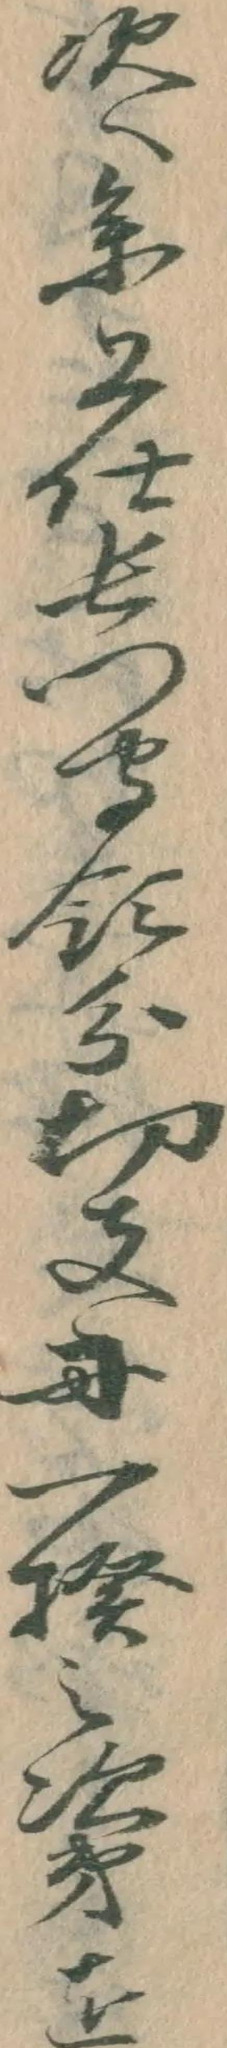次へ参上仕長門守領分切支丹一揆之次第を
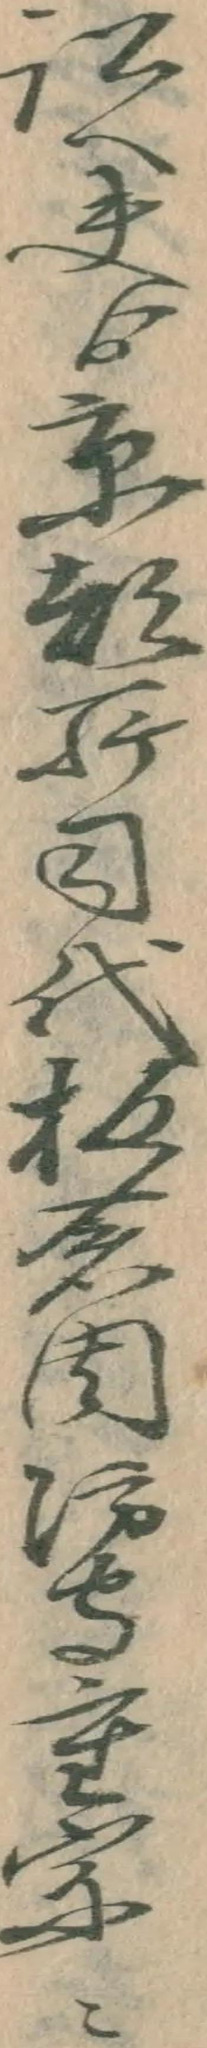訟へ夫ゟ京都所司代板倉周防守重宗に
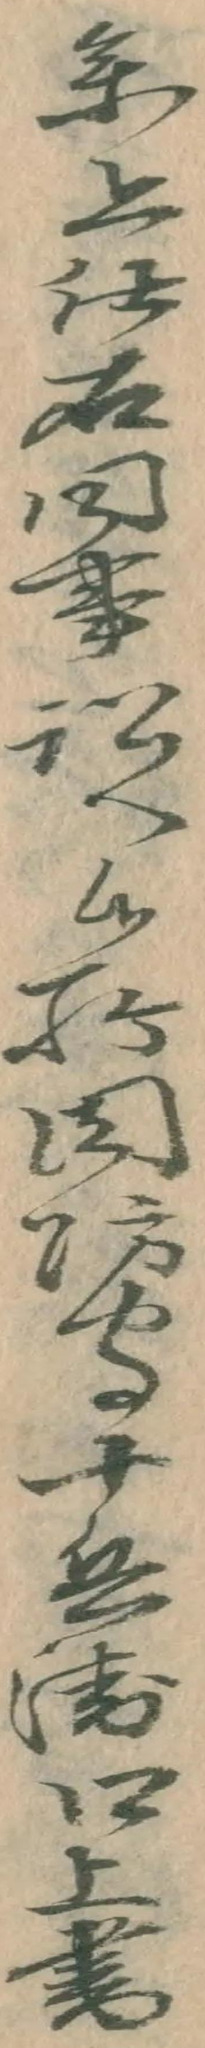参上仕右同事訟へ候所周防守十兵衛口上書

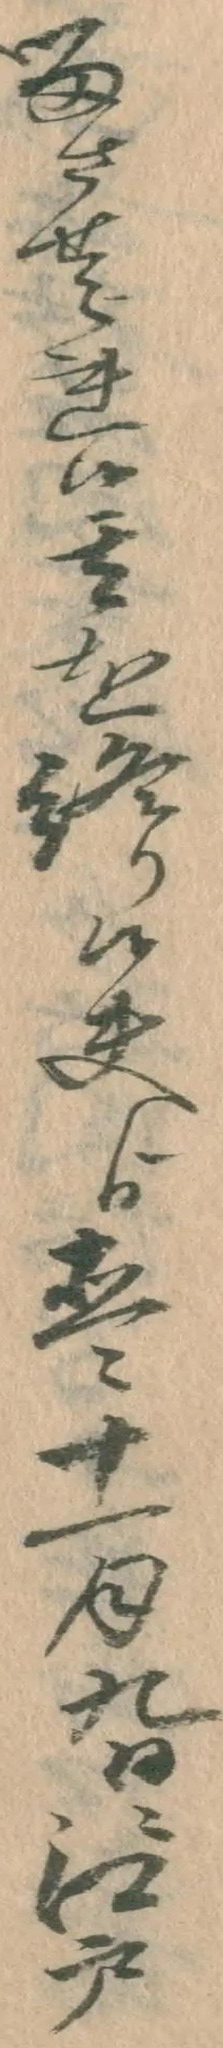留させら連候をを終り候夫ゟ直に十一月九日に江戸
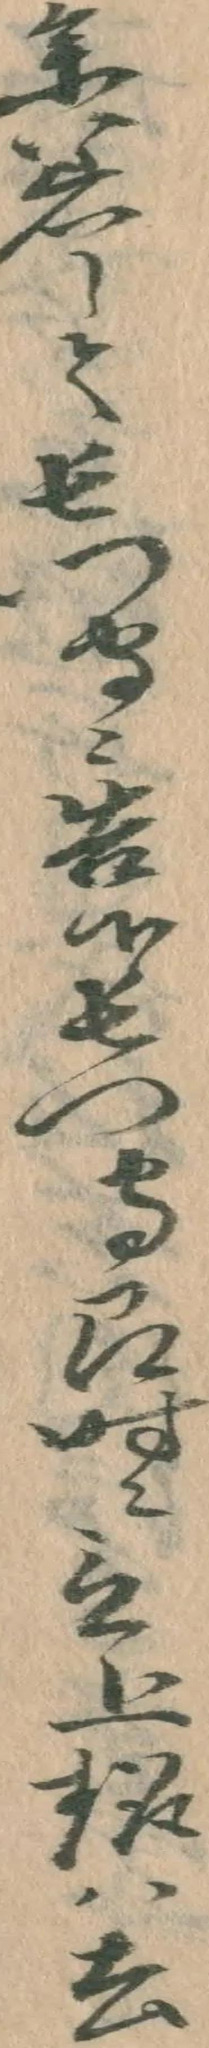参着して長門守に告候長門守即時に云上趣は去
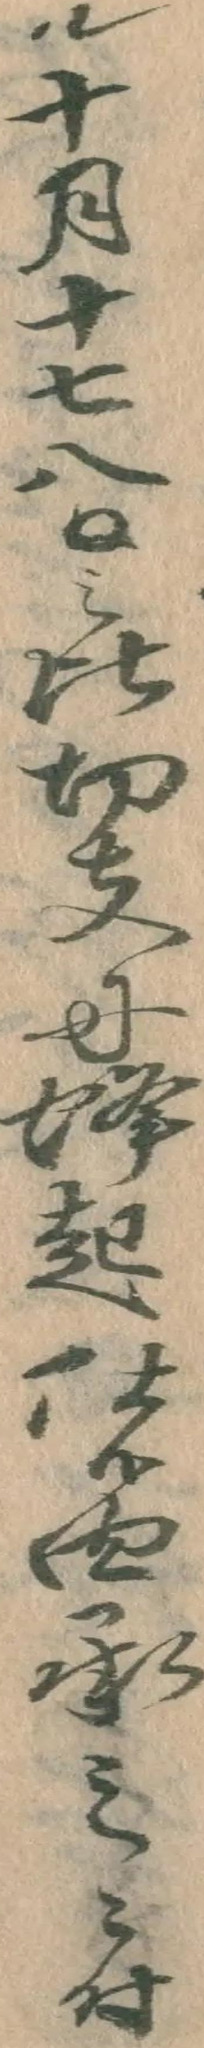る十月十七八日之比切支丹蜂起仕候由承之に付
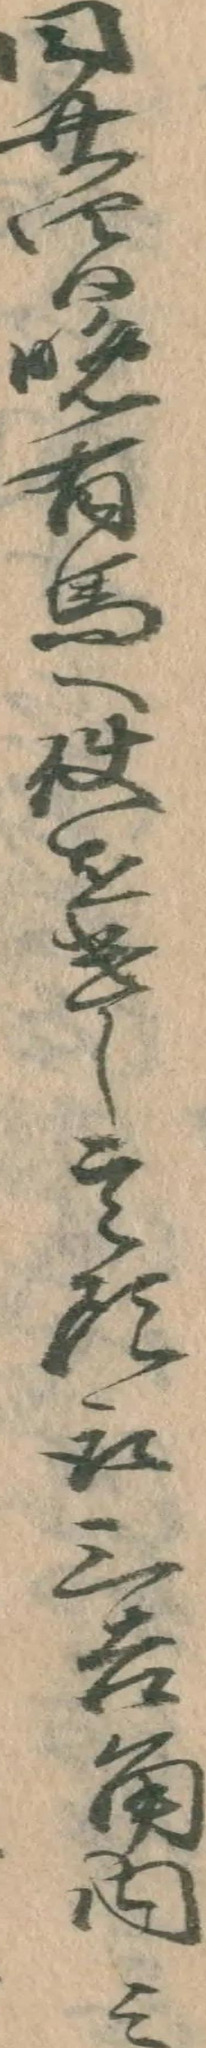同廿四日晩有馬へ使を遣し其頭取三吉角内与
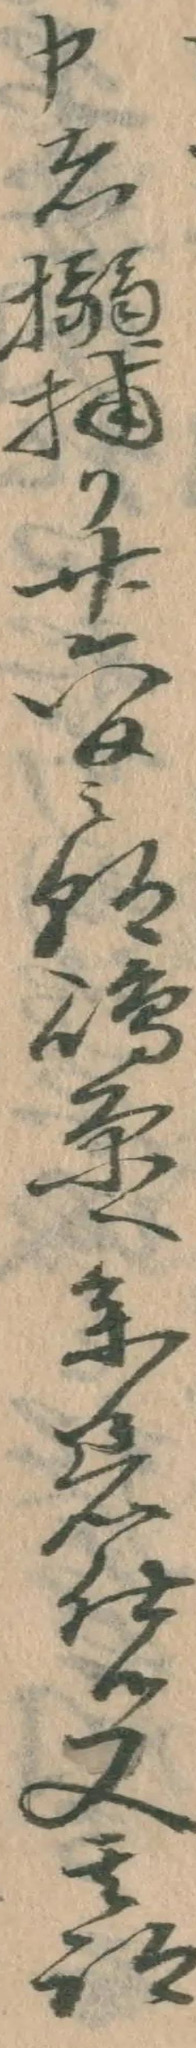申者搦捕りに廿六日之朝島原へ参着仕候又其跡
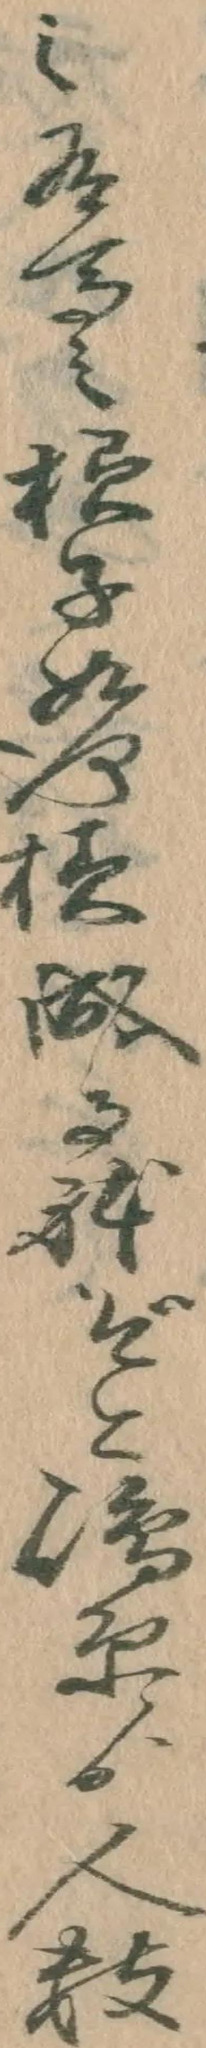之有馬之様子如何様成る躰ぞと島原ゟ人数
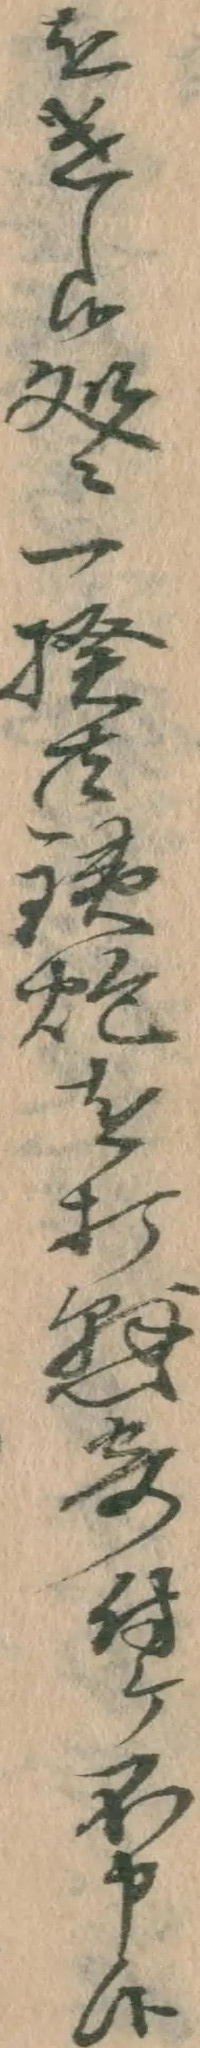を遣し候処に一揆共鉄炮を打懸寄付け不申候
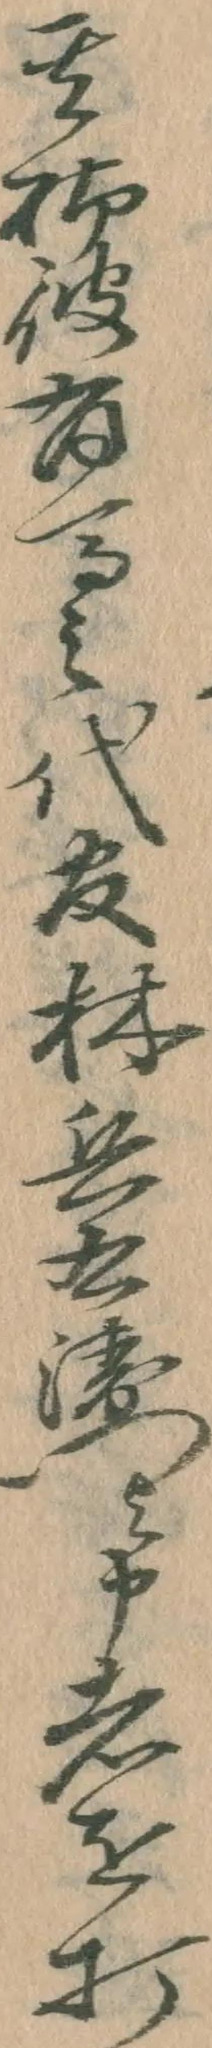其砌彼有馬之代官林兵右衛門与申者を打
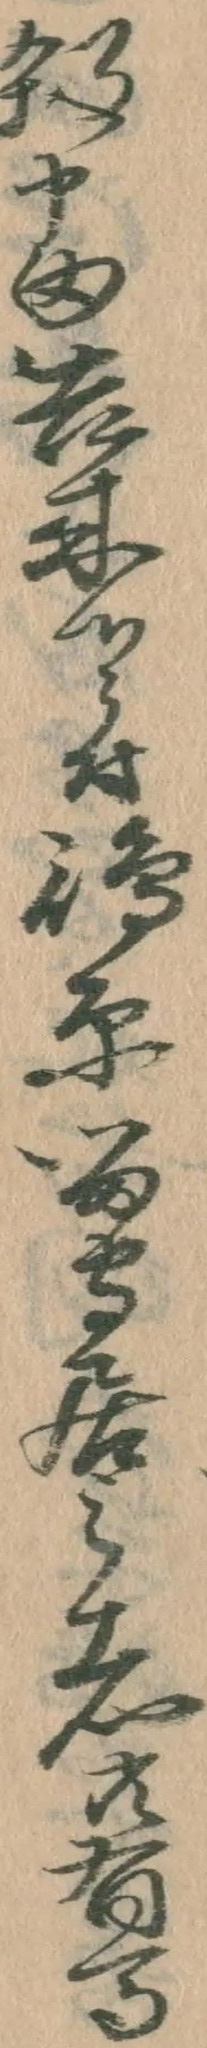殺申由告来候に付島原留守居之者共有馬
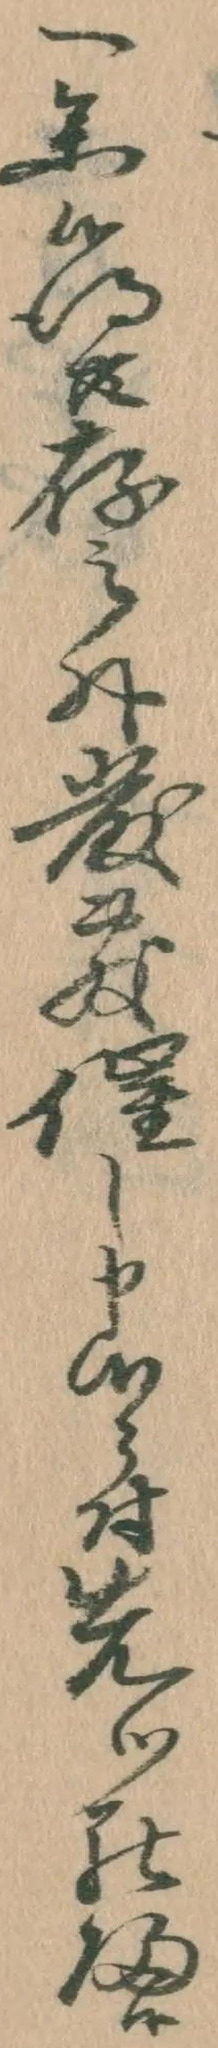へ参候得共存之外厳敷催し申候に付先候罷帰候
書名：切支丹御退治記 49巻. [2]
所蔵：国立国会図書館 National Diet Library, JAPAN
